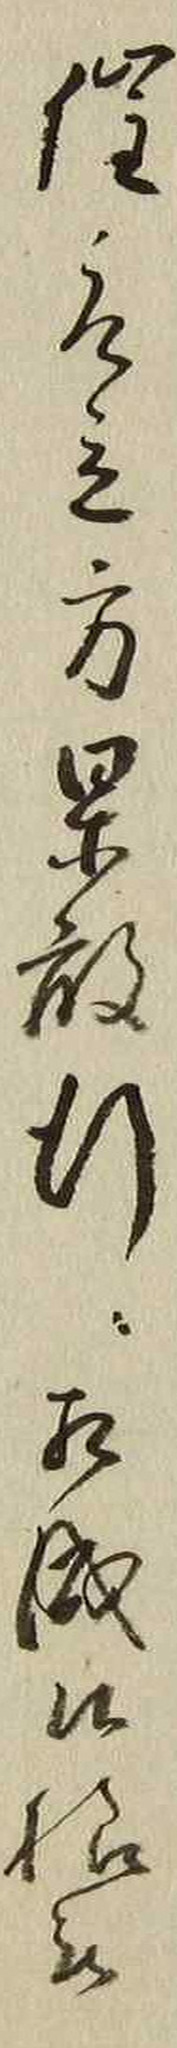催取立方果敢行ニ相成候様被
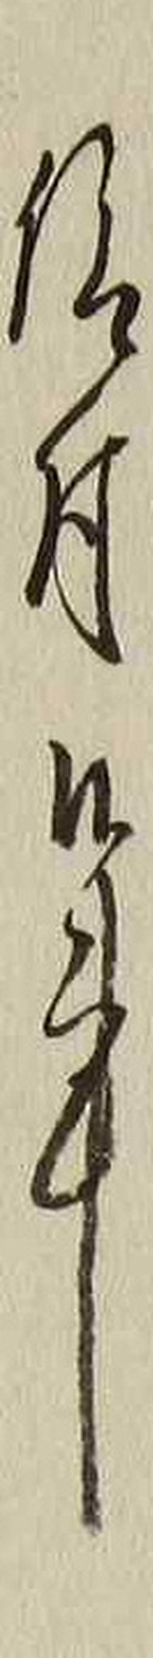仰付候事
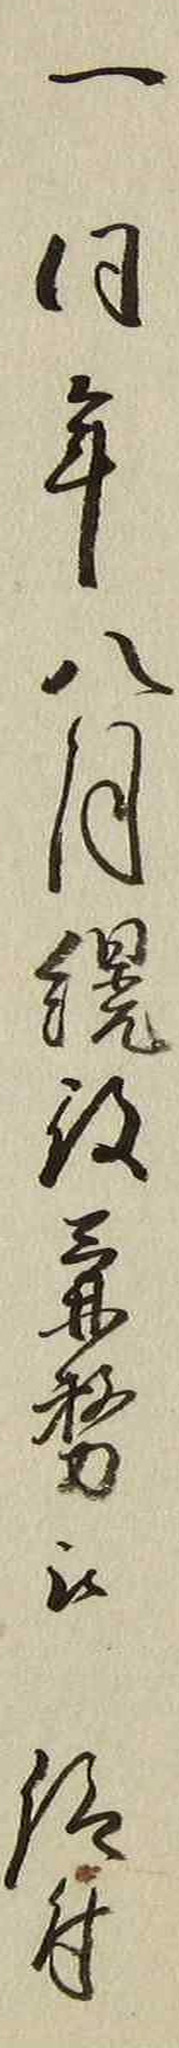一同年八月縨役兼務被仰付
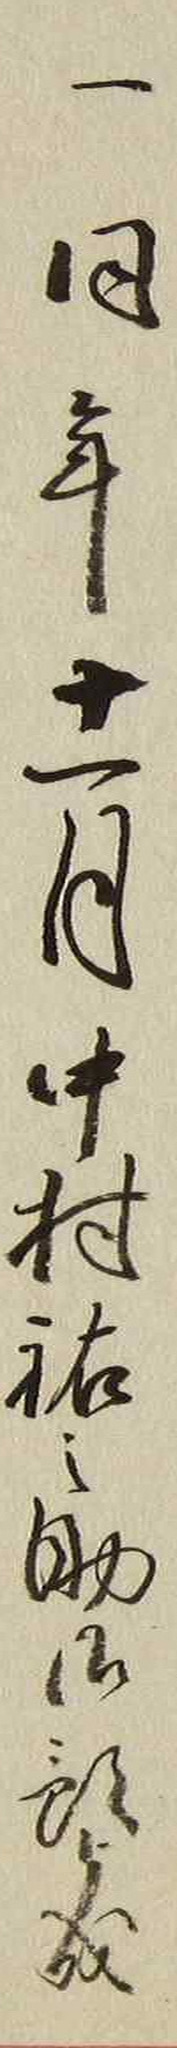一同年十一月中村祐之助御預被成
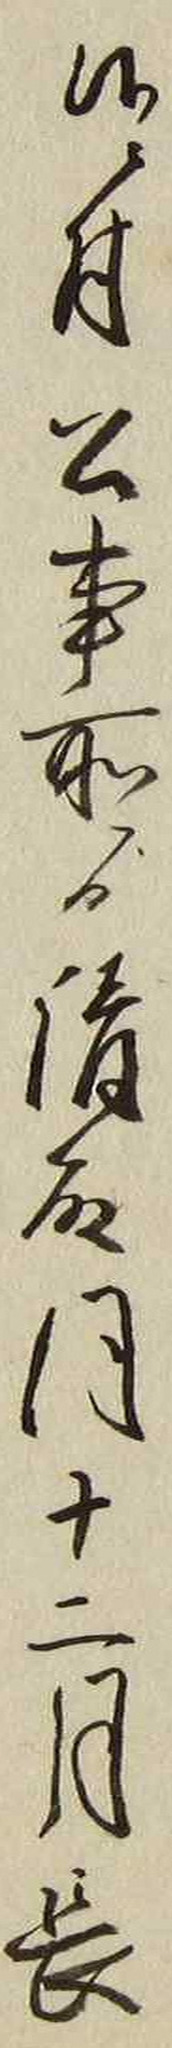候ニ付公事所ゟ請取同十二月長
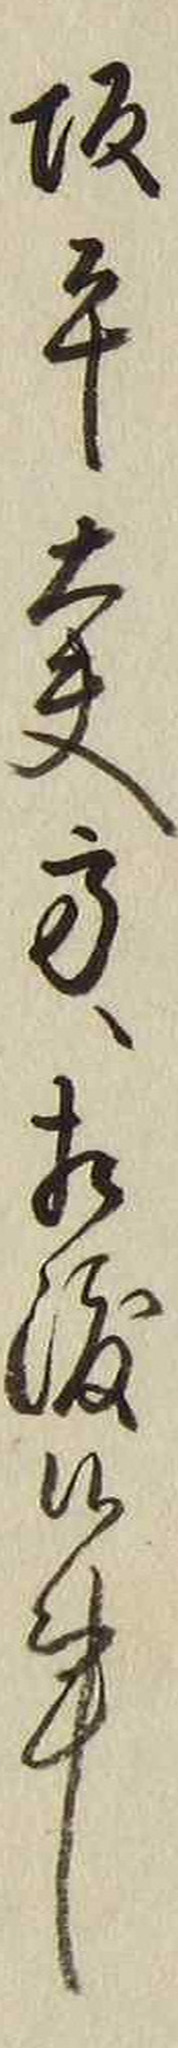坂平大夫方へ相渡候事

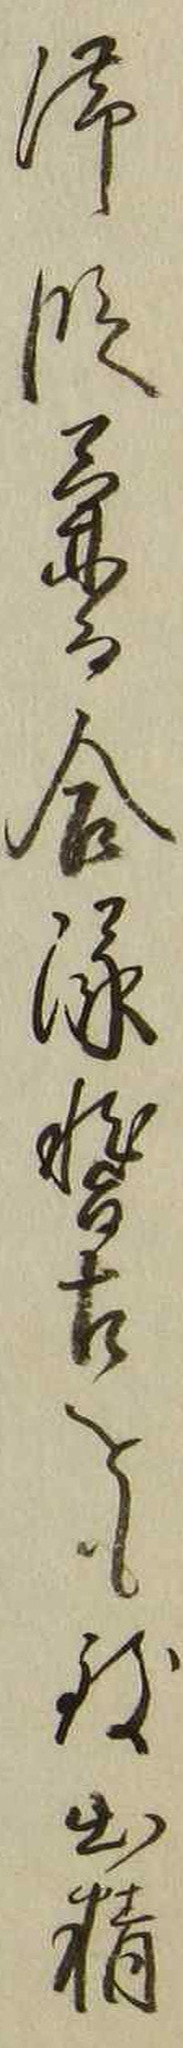滞段兼而合隊稽古をも致出精
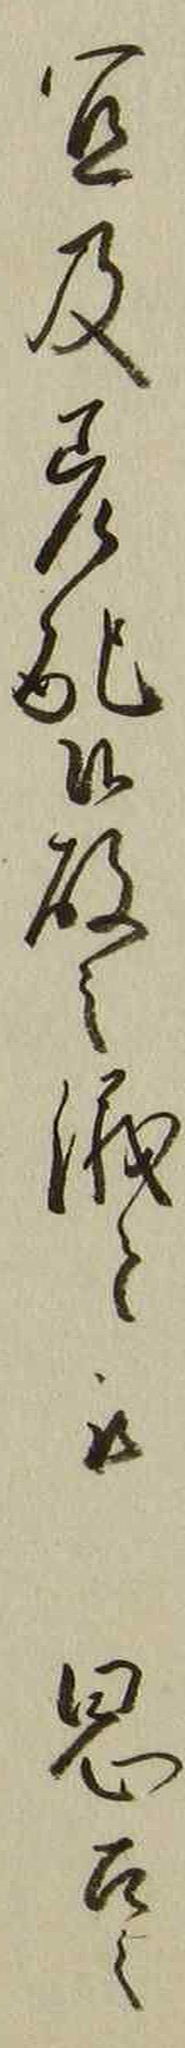宜及差配候故の儀と被思召の
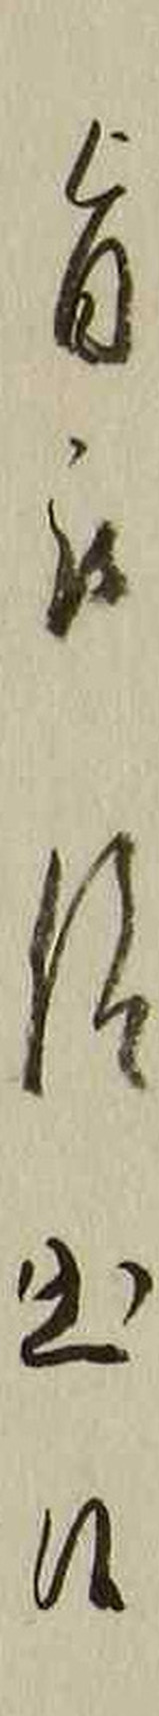旨被仰出候
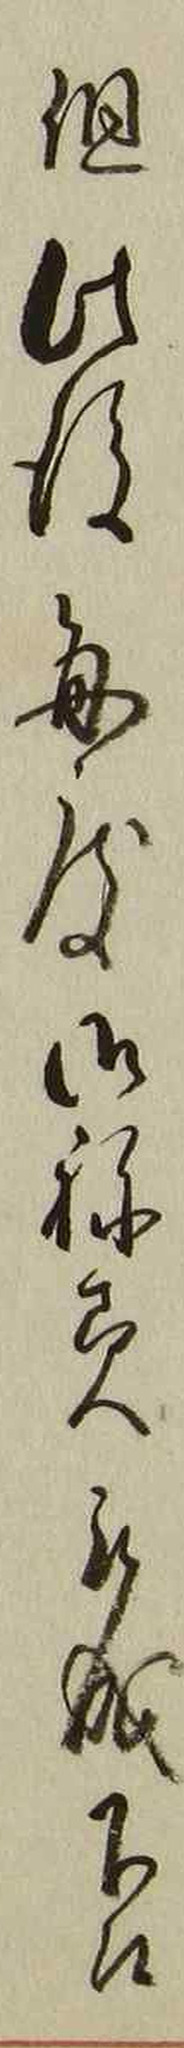但此後毎度御称美被成下候
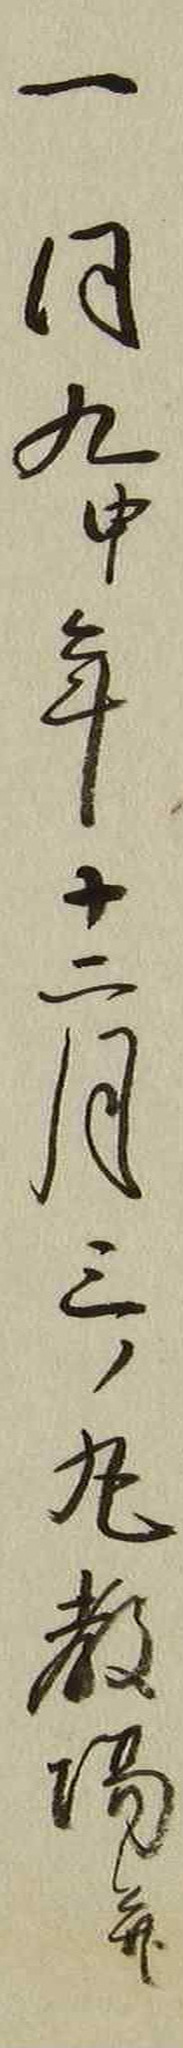一同九申年十二月三ノ丸教場幷
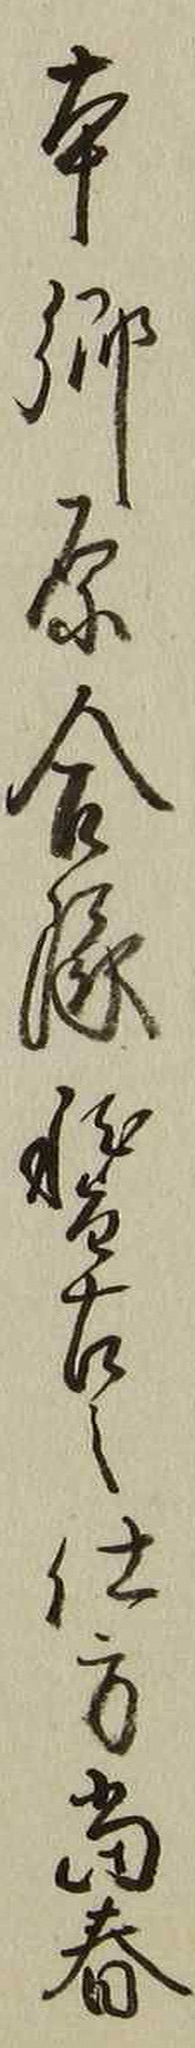本郷原合隊稽古の仕方当春
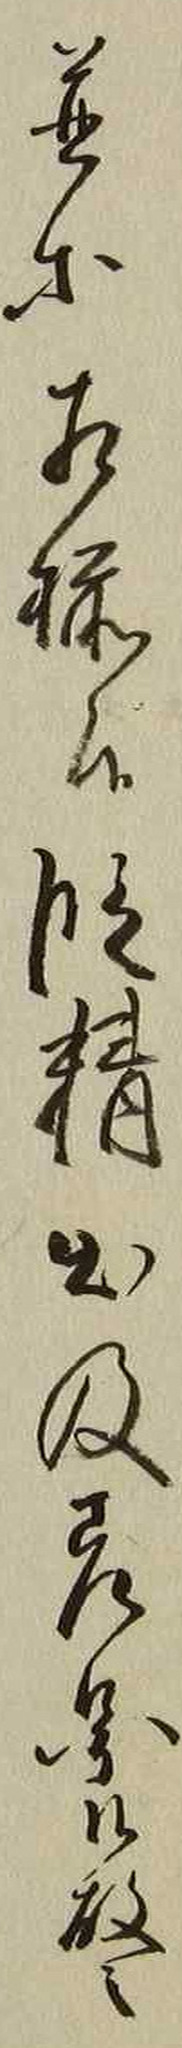並等相揃候段精出及差図候故の
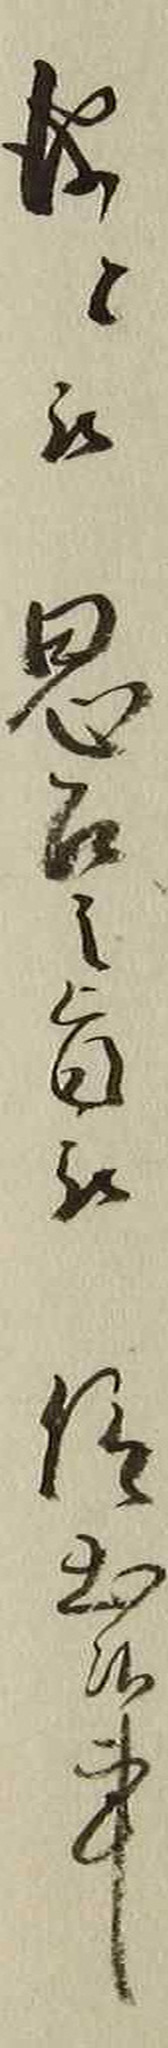儀と被思召の旨被仰出候事
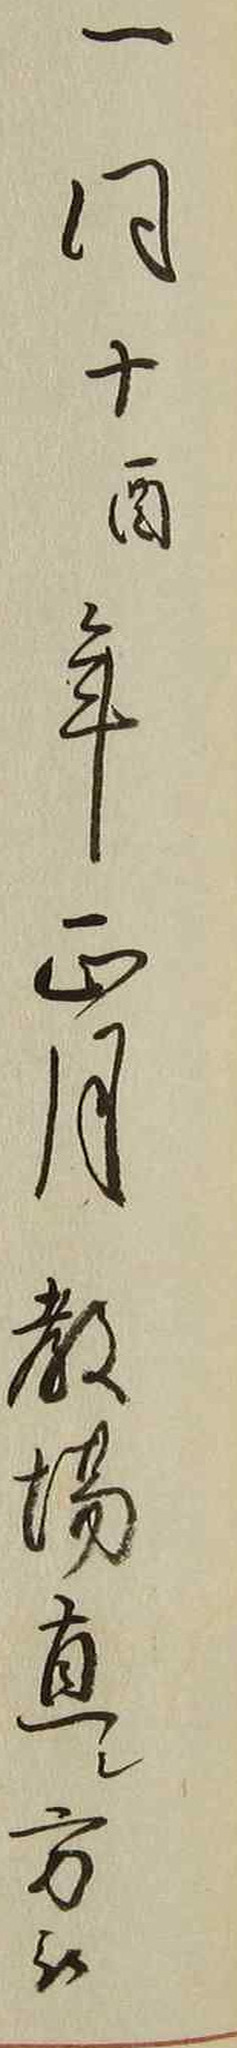一同十酉年正月教場直し方被
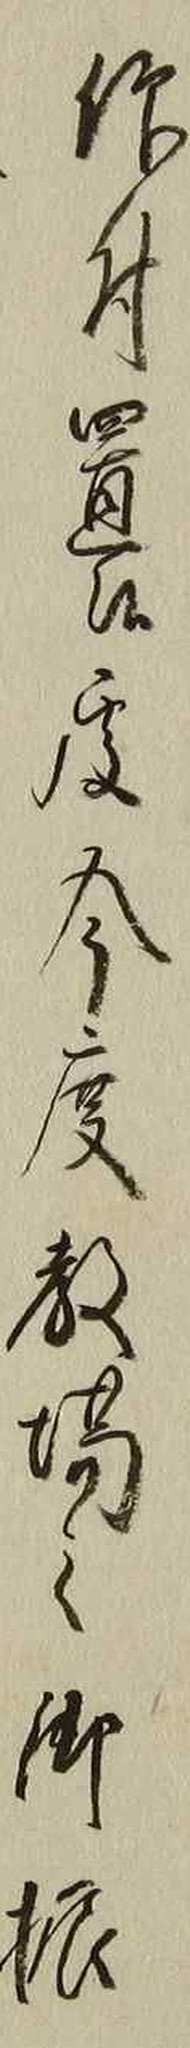仰付置候処今度教場の御振
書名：諸士系譜　巻之1　い之部1
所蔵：会津若松市立会津図書館
